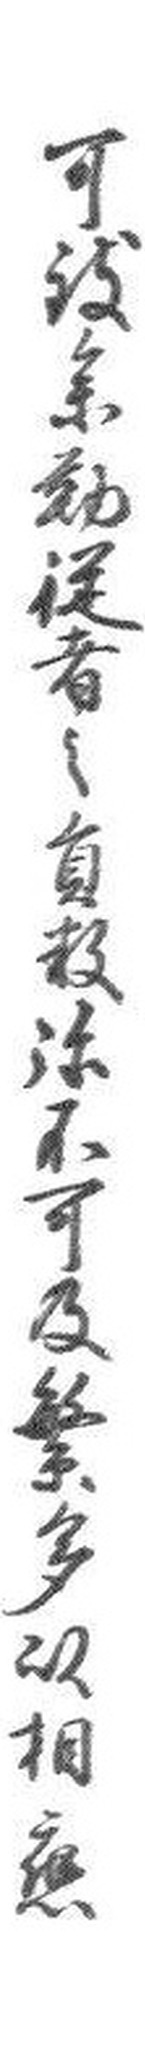可致参勤従者之員数弥不可及繁多以相応
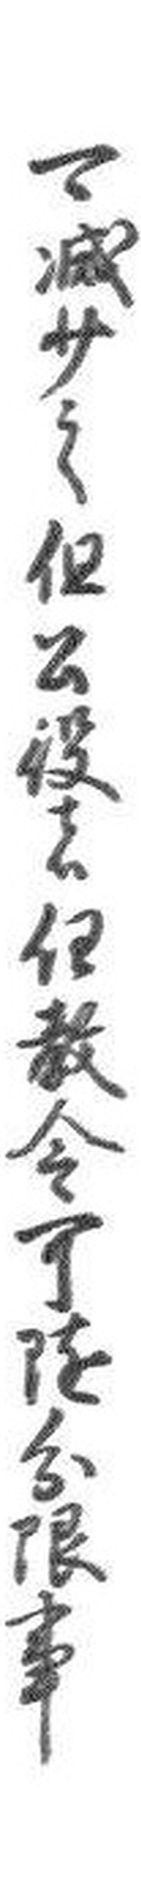可減少之但公役者任教令可随分限事
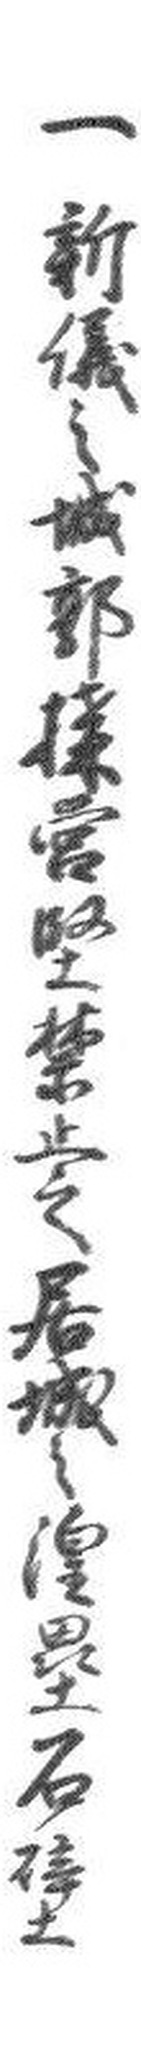一新儀之城郭構営堅禁止之居城之湟塁石壁
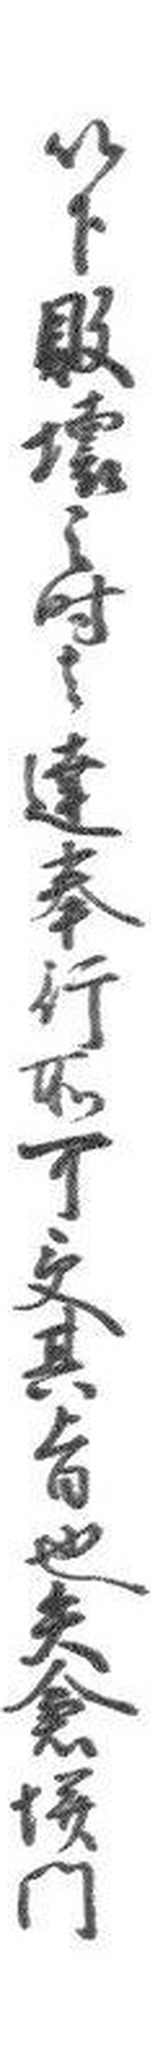以下取壊之時は達奉行所可受其旨也矢倉塀門
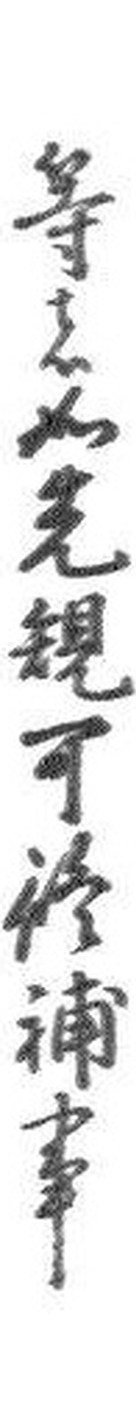等者如先規可修補事

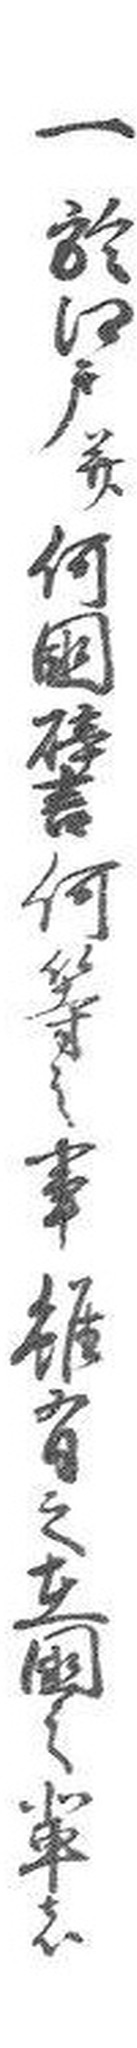一於江戸并何国譬何等之事雖有之在国之輩者
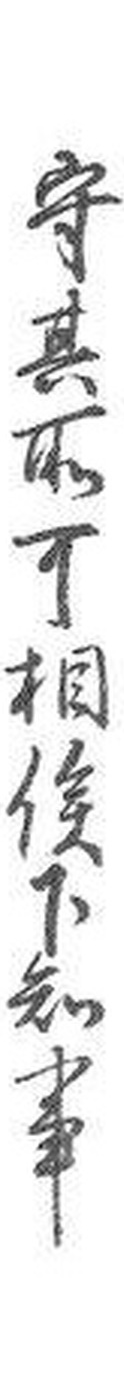守其所可相俟下知事
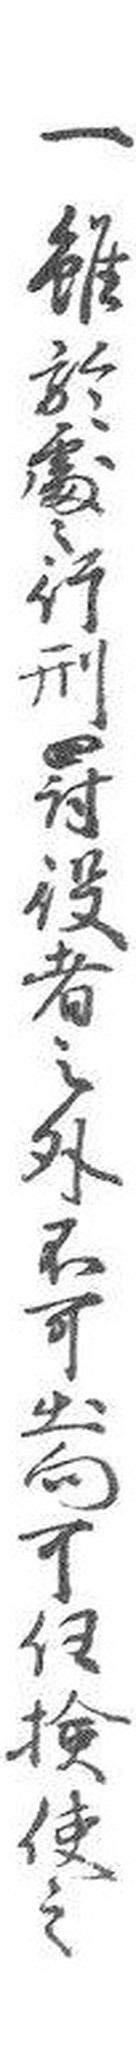一雖於處々行刑罰役者之外不可出向可任検使之
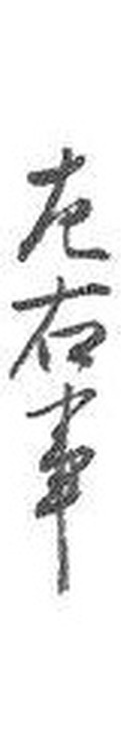左右事
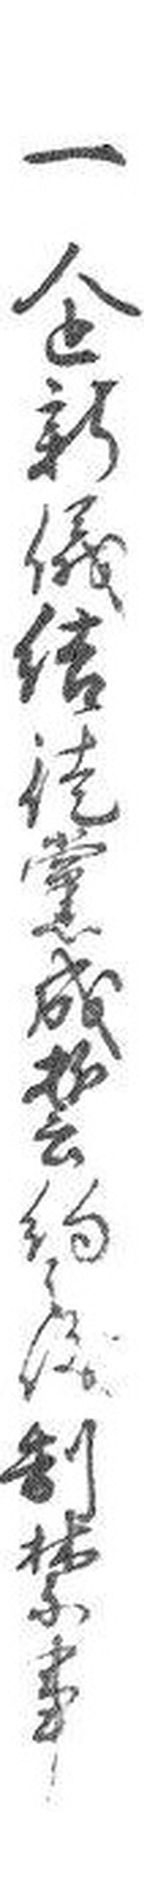一企新儀結徒党成誓約之儀制禁事
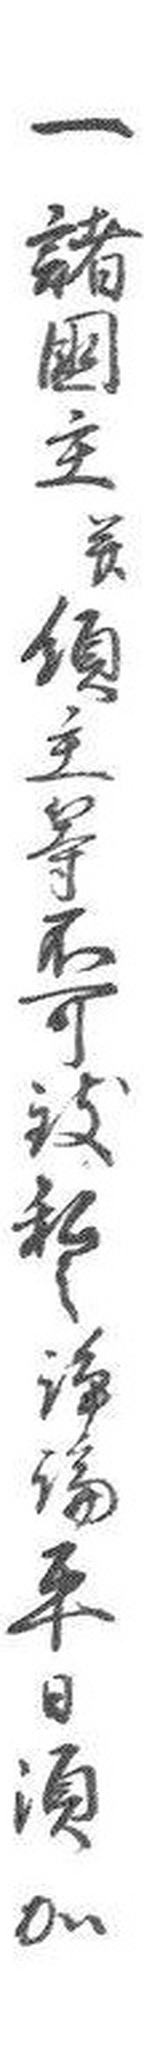一諸国主并領主等不可致私之諍論平日須加
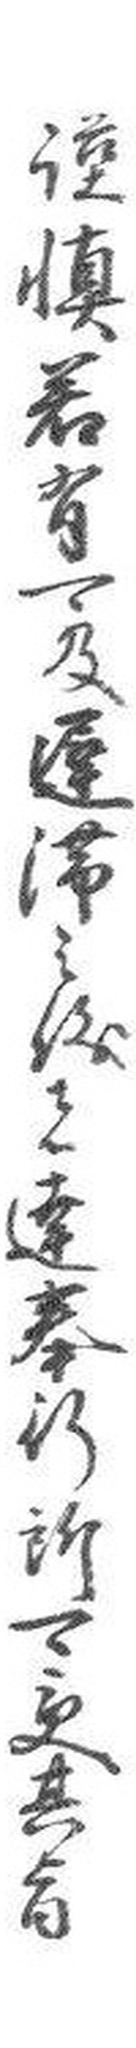謹慎若有可及遅滞之儀は達奉行所可受其旨
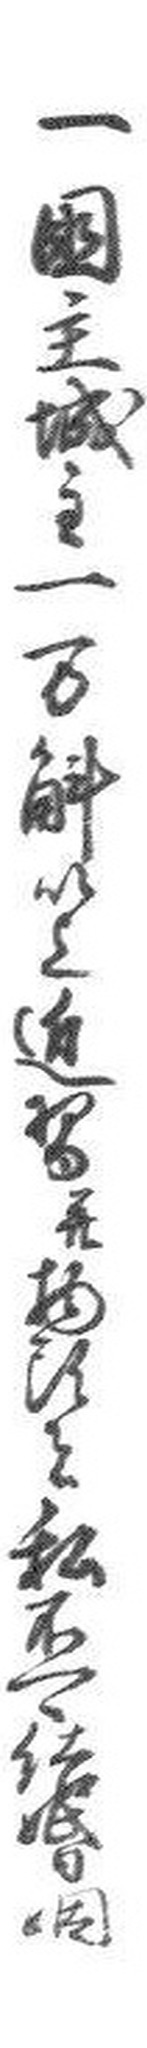一国主城主一万斛以上近習并物頭は私不可結婚姻
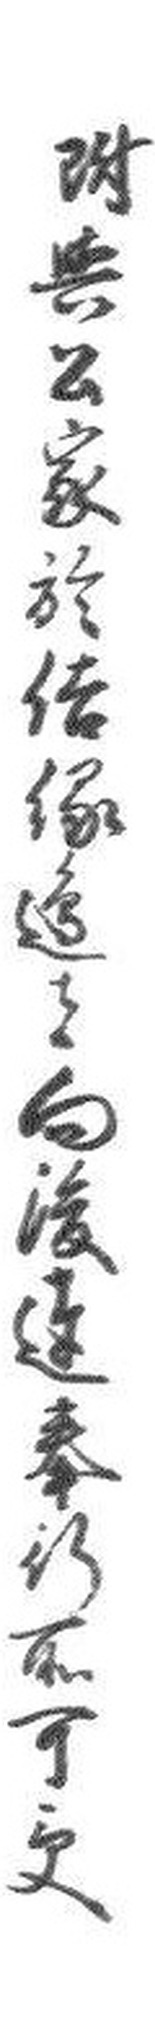附与公家於結縁辺は向後達奉行所可受
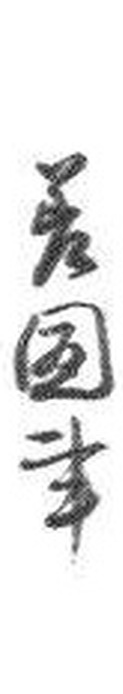差図事
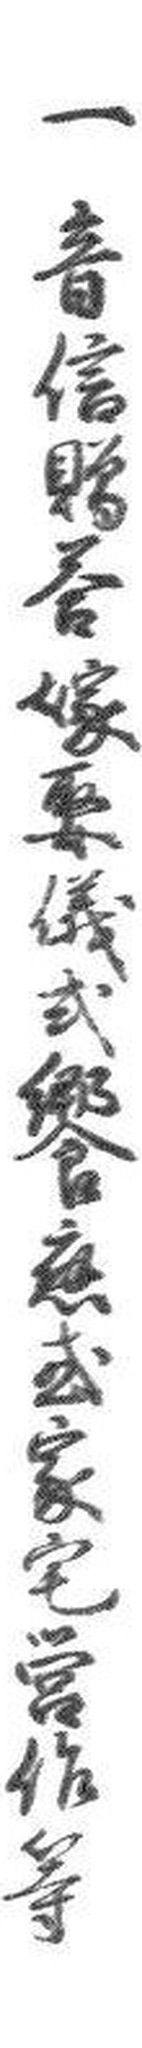一音信贈答嫁娶儀式饗応或家宅営作等
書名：家譜 六 光通公 従万治三年到寛文三年
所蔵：福井県文書館 Fukui Prefectural Archives
